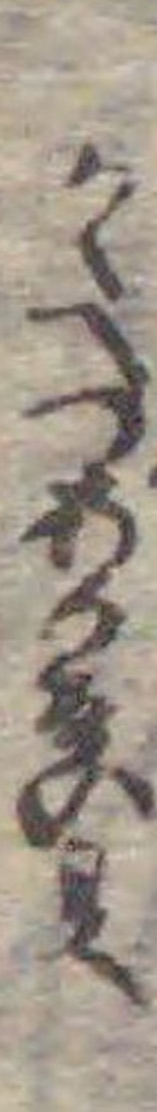かくへつあかるいわへ

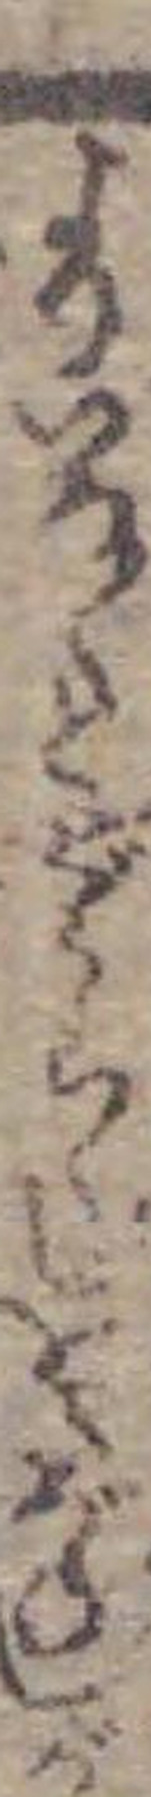よりいろ〳〵どうらくしをたづねしが
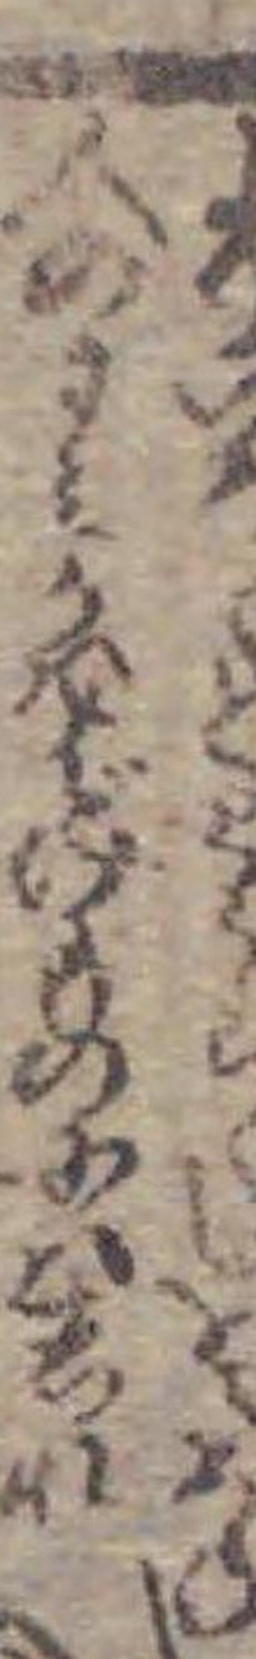人のすみかはばけものにはしれ
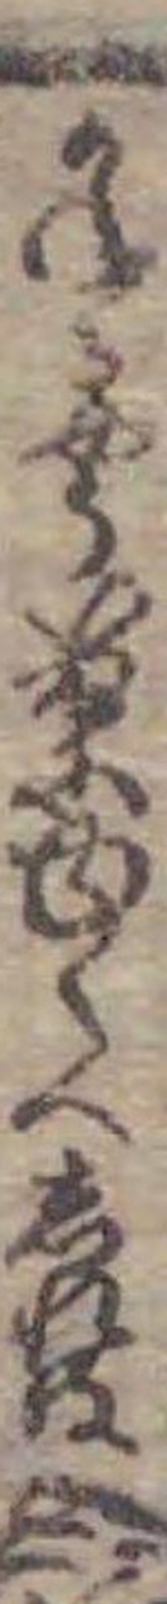かねやういつくにゆくへしれぬ
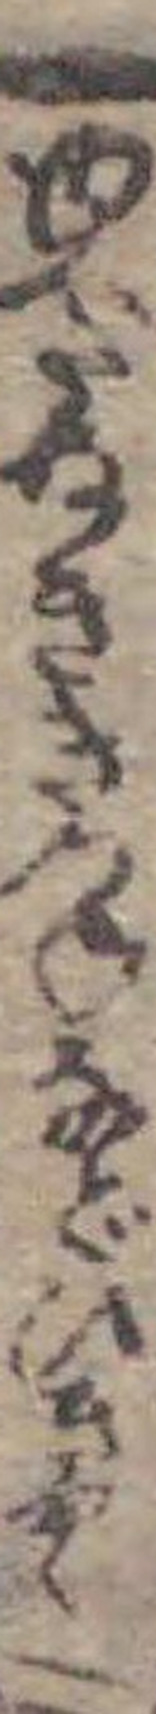ゆへたぬききつねなどひきやく
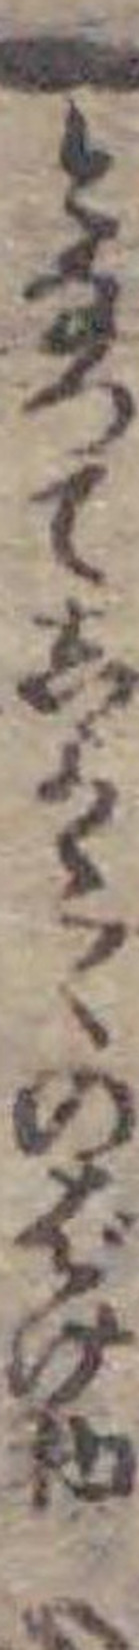となつてしよこくのばけ物
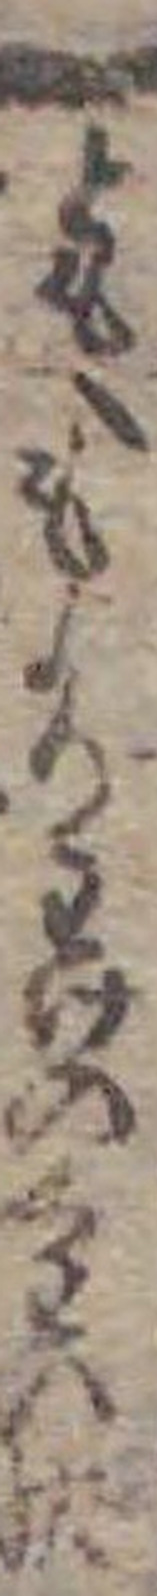ともへもよりわけのくわい状
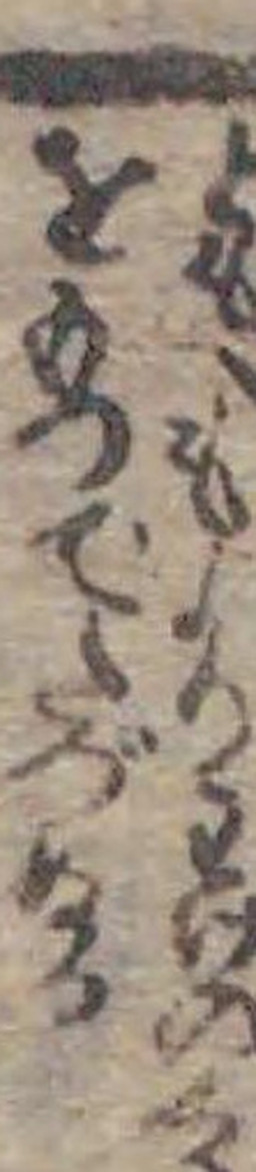をもつてたづぬる
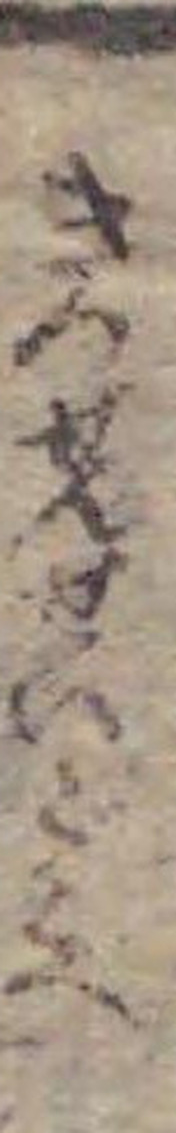きつせんせいどこへ
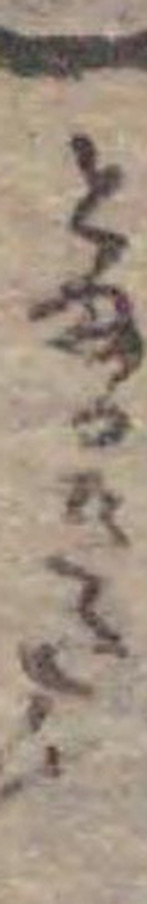とまるきた
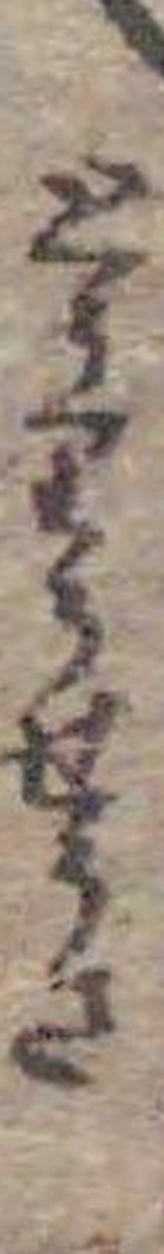とうりうせうさ
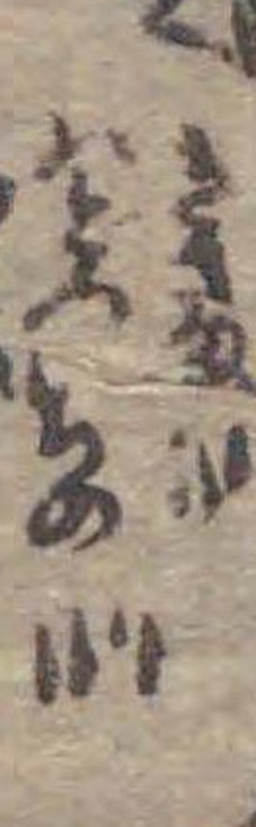はどつちの

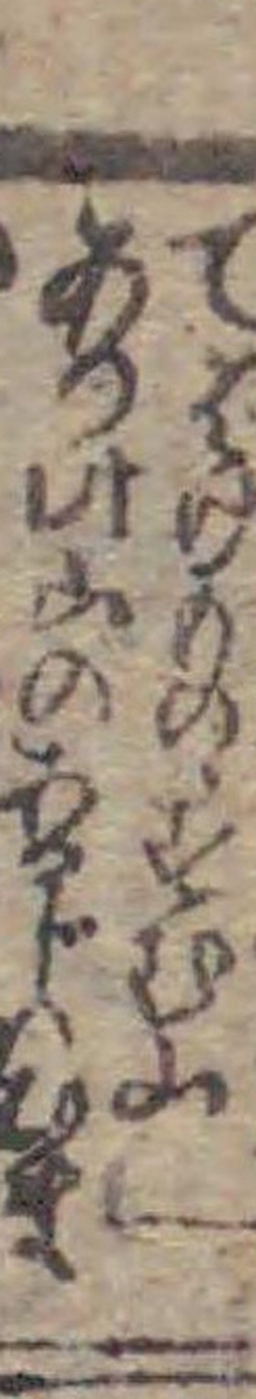あり此山のあるじはむま
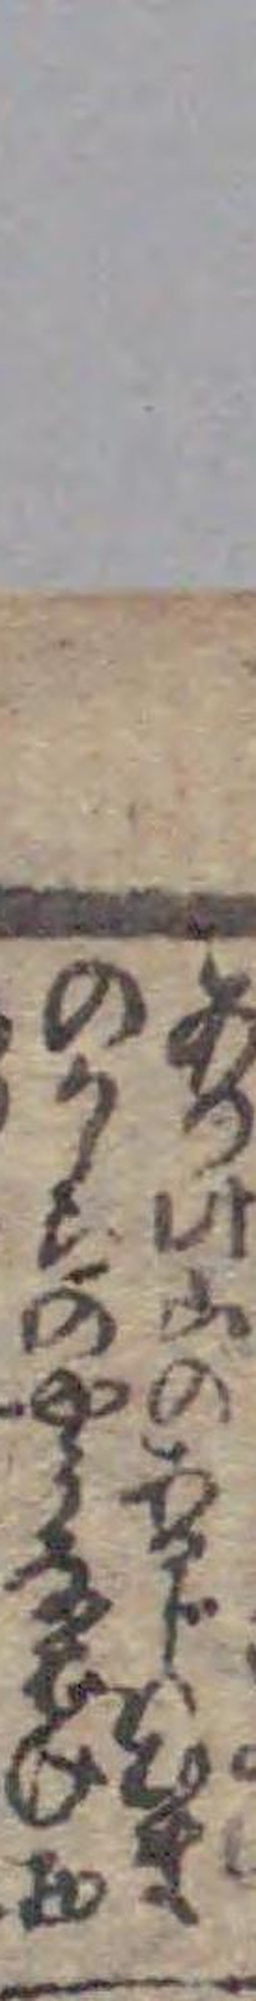のかしらのやうなばけ物
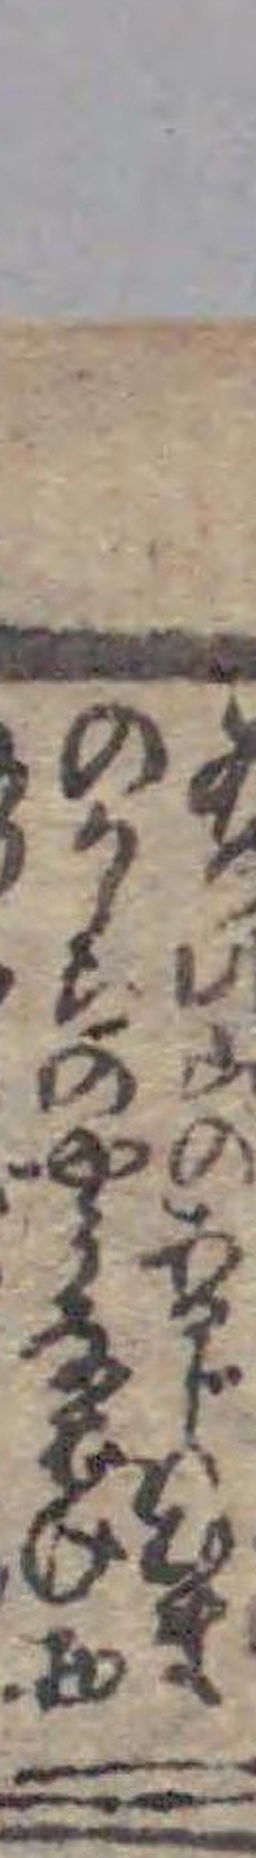のかしらのやうなばけ物
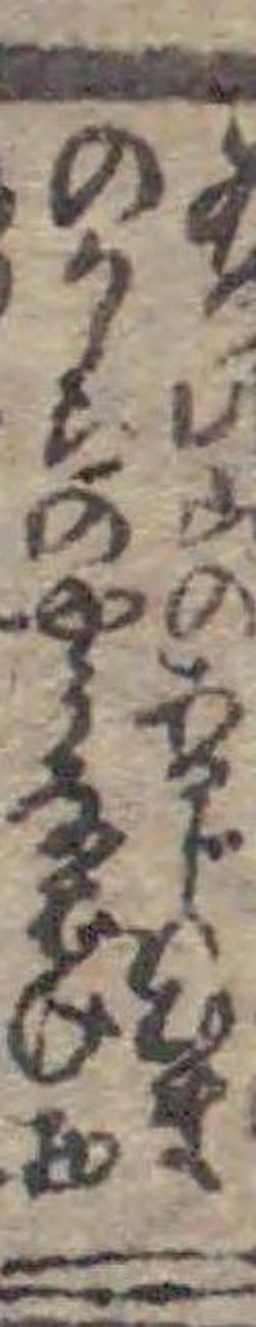のかしらのやうなばけ物
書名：[化物一代記] : 5巻
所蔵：国立国会図書館 National Diet Library, JAPAN
